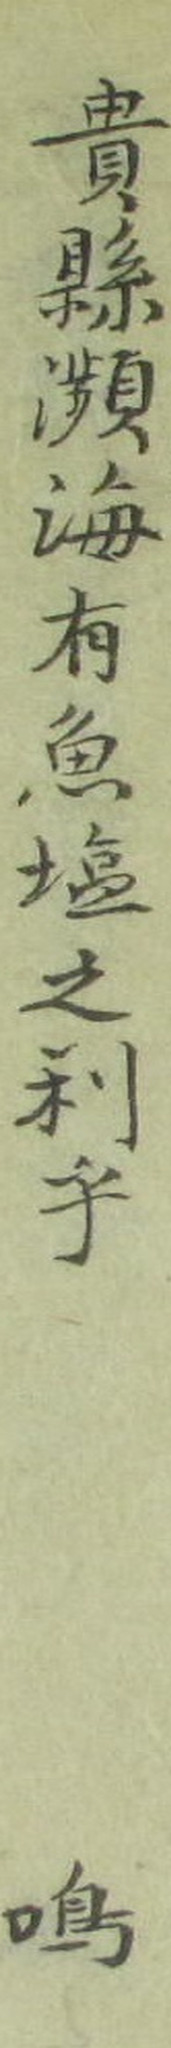貴県瀕海有魚塩之利乎鳴
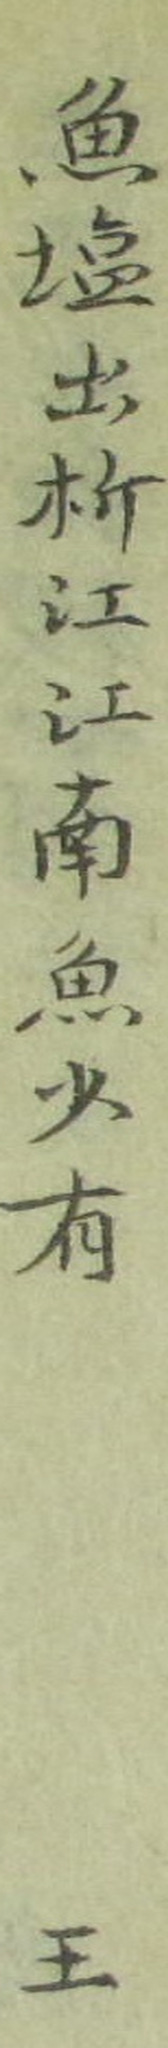魚塩出析江江南魚少有王
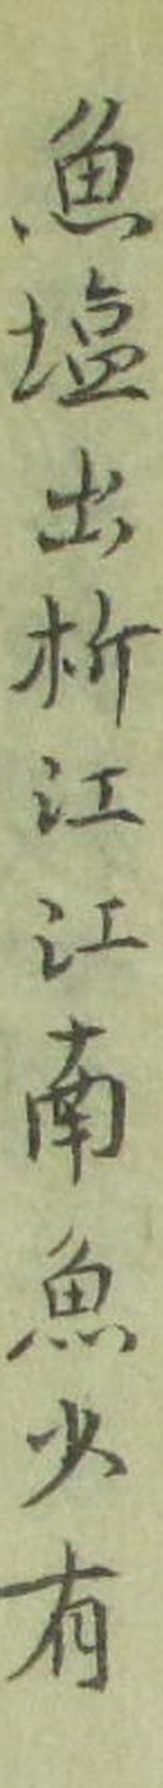魚塩出析江江南魚少有王
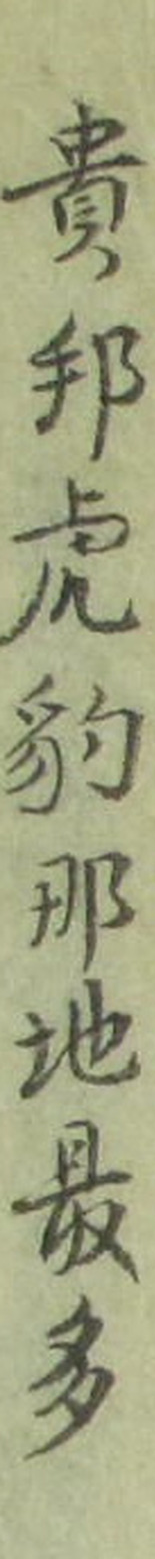貴邦虎豹那地最多鳴
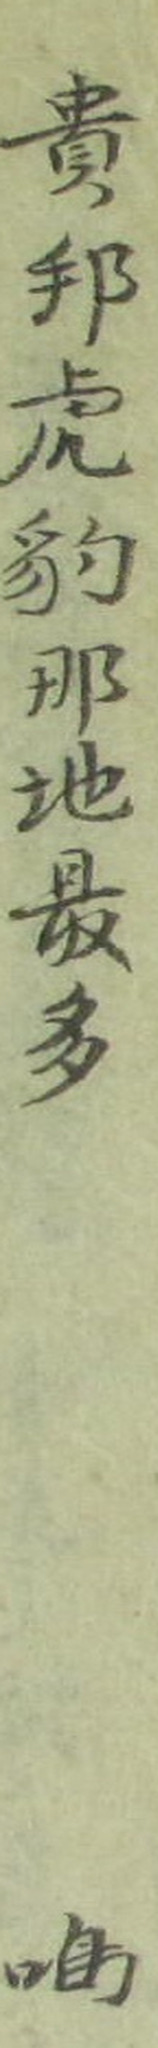貴邦虎豹那地最多鳴
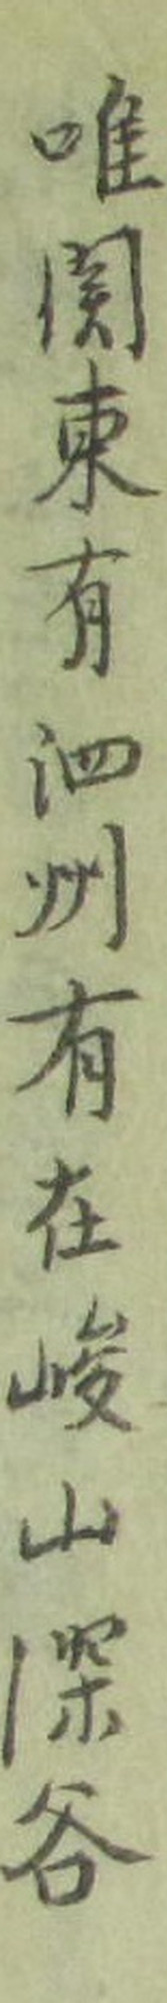唯関東有泗州有在峻山深谷王
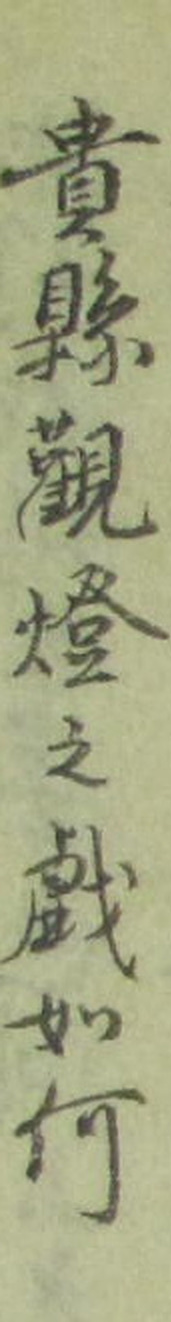貴県観燈之戯如何鳴
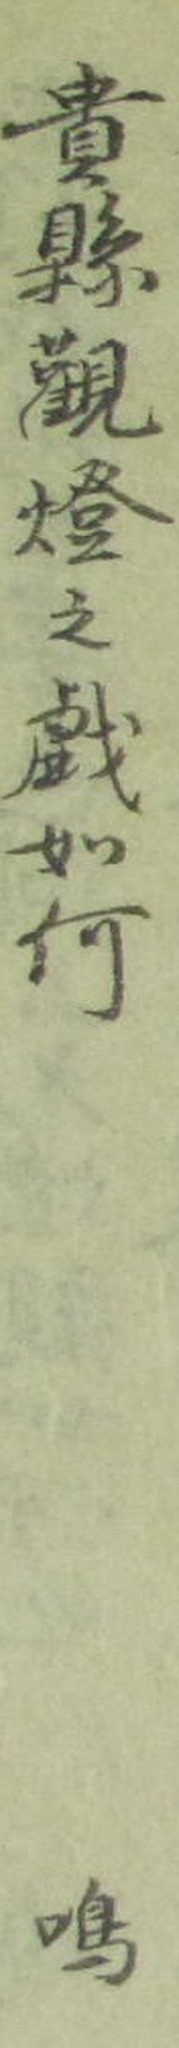貴県観燈之戯如何鳴
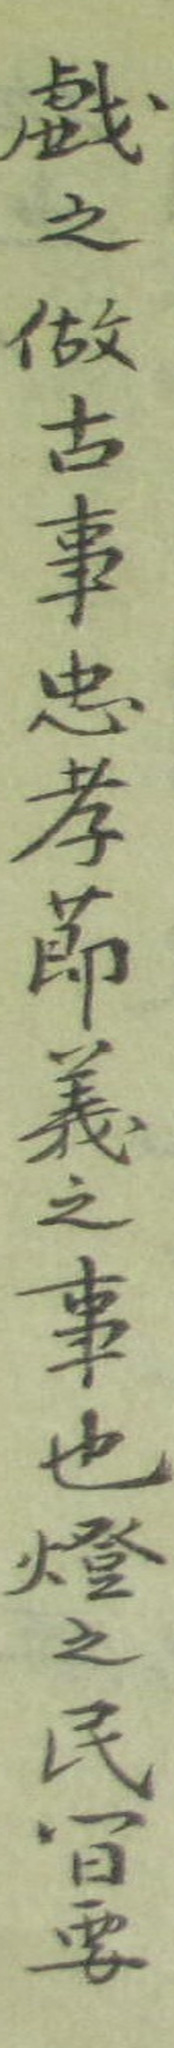戯之做古事忠孝節義之事也燈之民間要

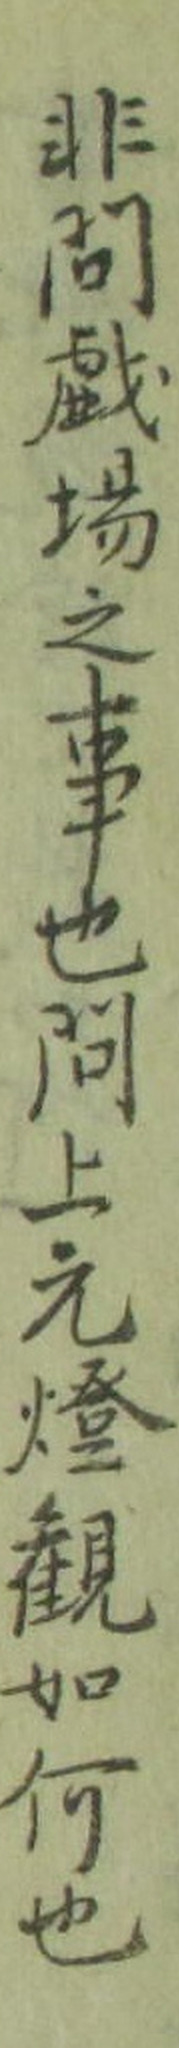非問戯場之事也問上元燈観如何也鳴
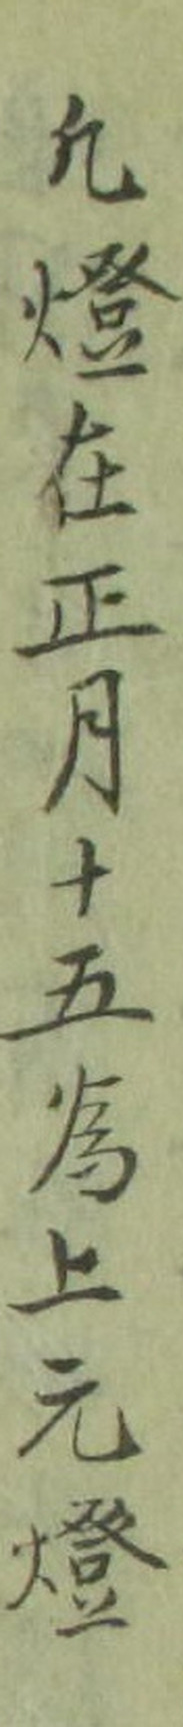凡燈在正月十五為上元燈王
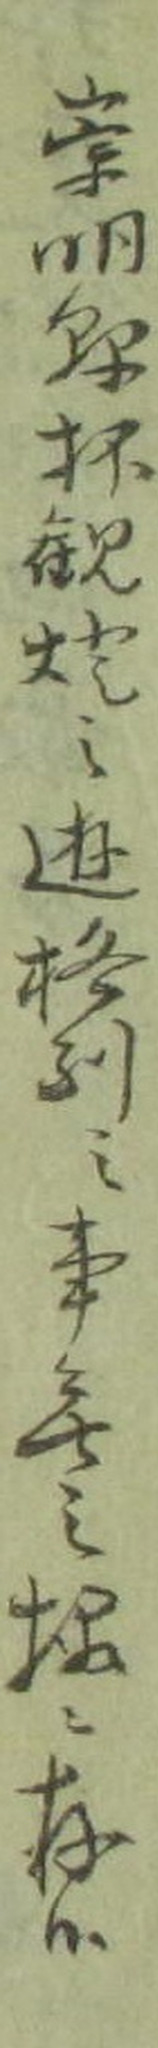崇明県抔観燈之遊格別之事無之様ニ存候
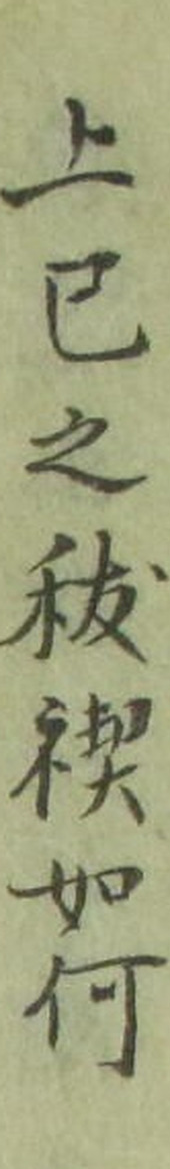上巳之秡禊如何鳴
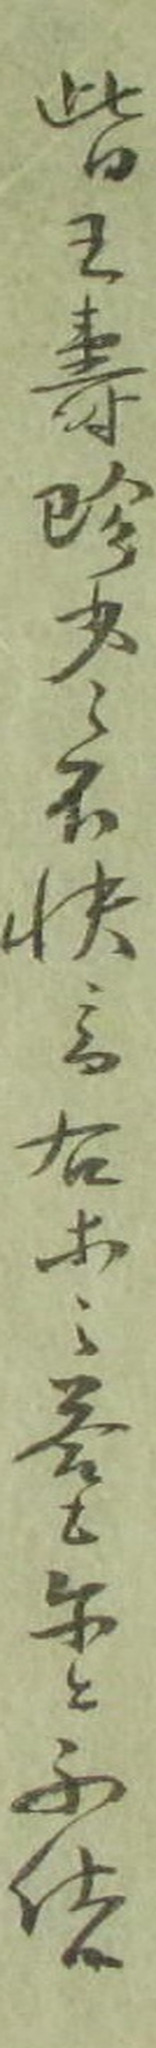此日王寿珍少々不快ニ而右等之答も尓と不仕候
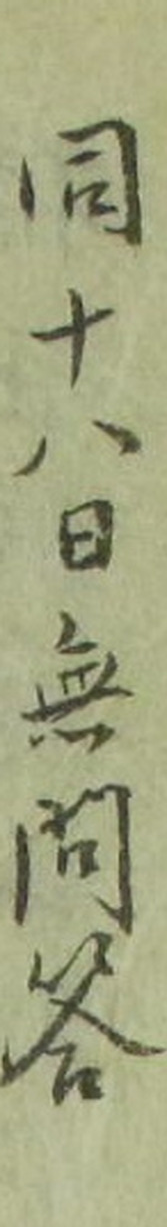同十八日無問答
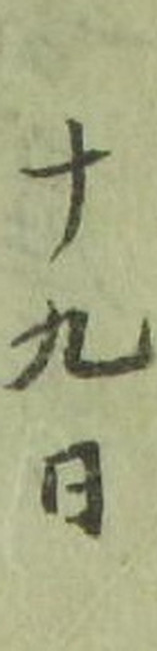十九日
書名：紀州九木浦庄屋記録 四
